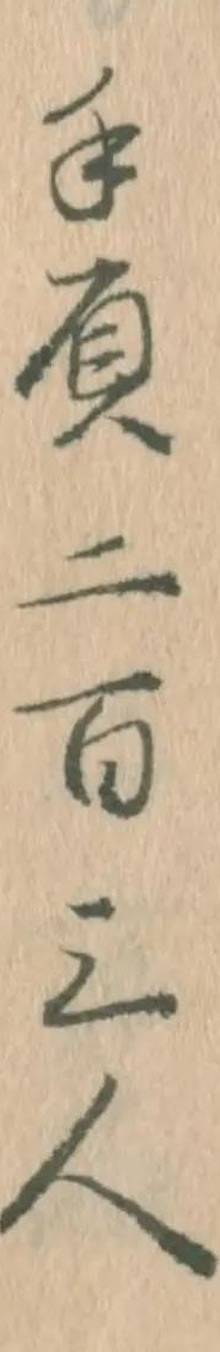手負二百三人
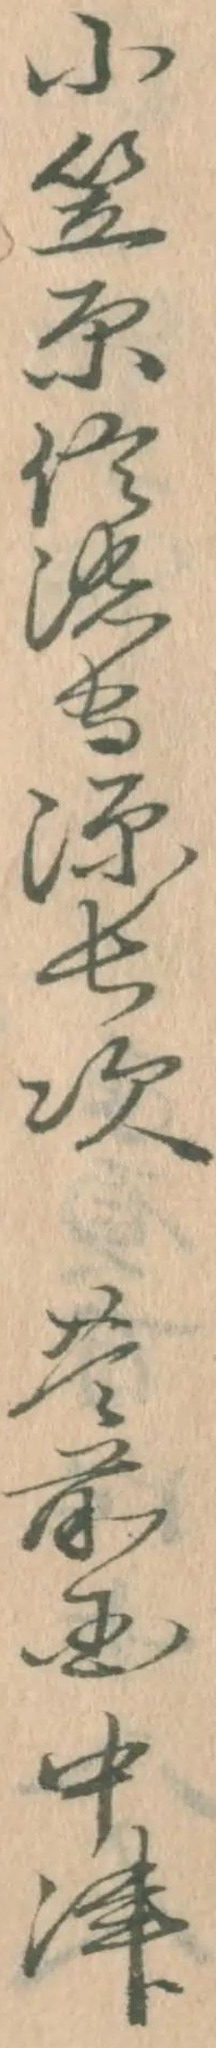小笠原信濃守源長次豊前国中津
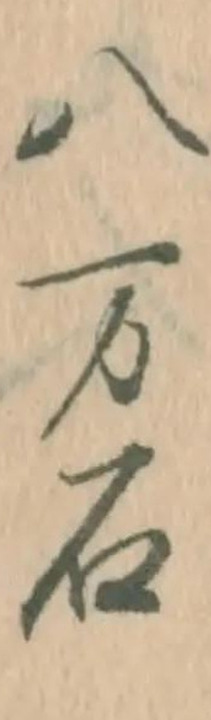八万石

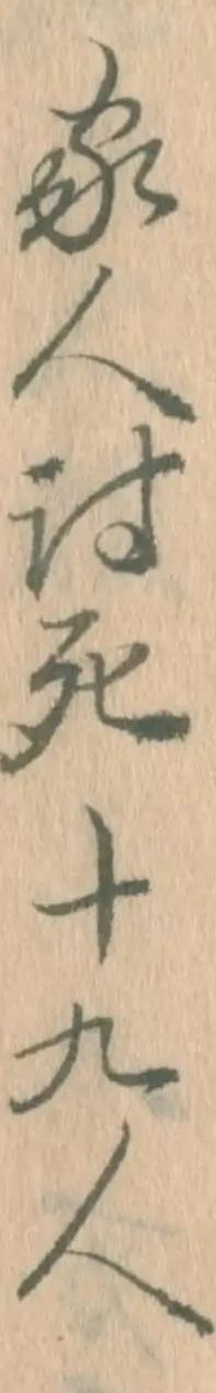家人討死十九人
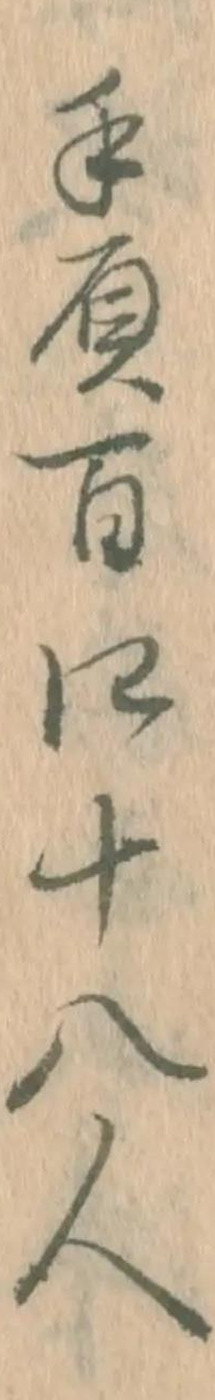手負百四十八人
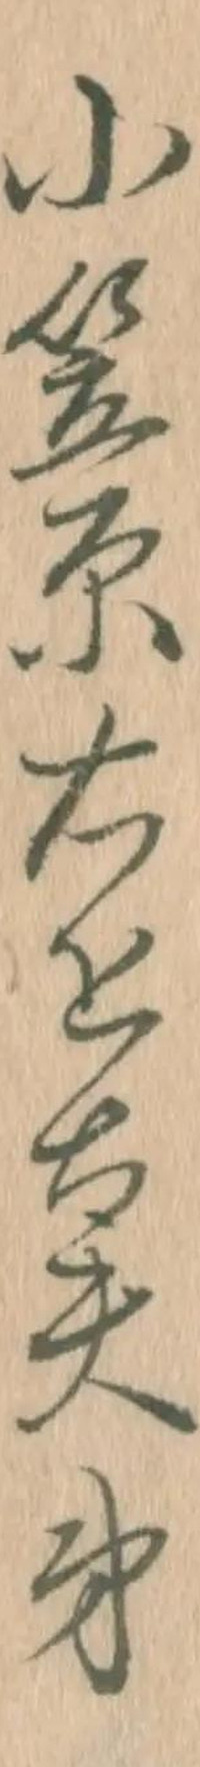小笠原右近太夫弟
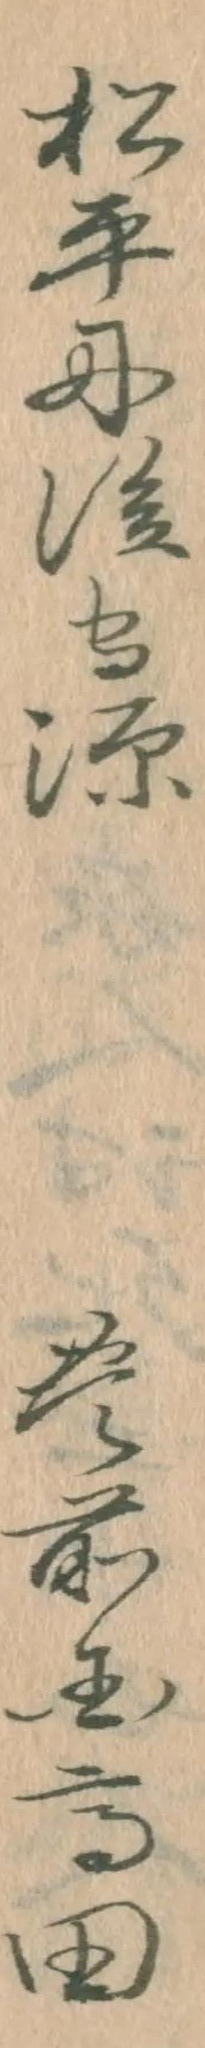松平丹後守源豊前国高田
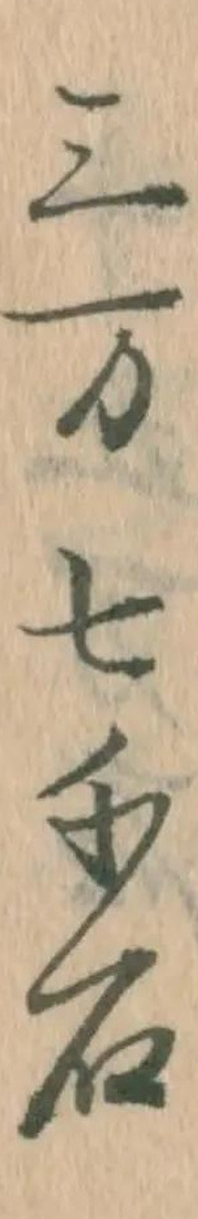三万七千石
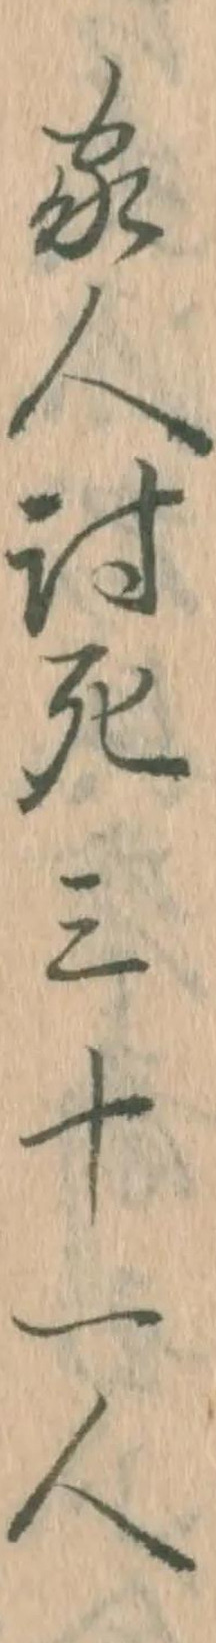家人討死三十一人
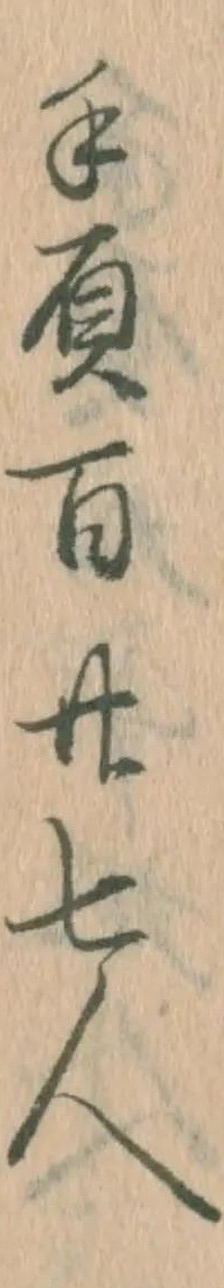手負百廿七人
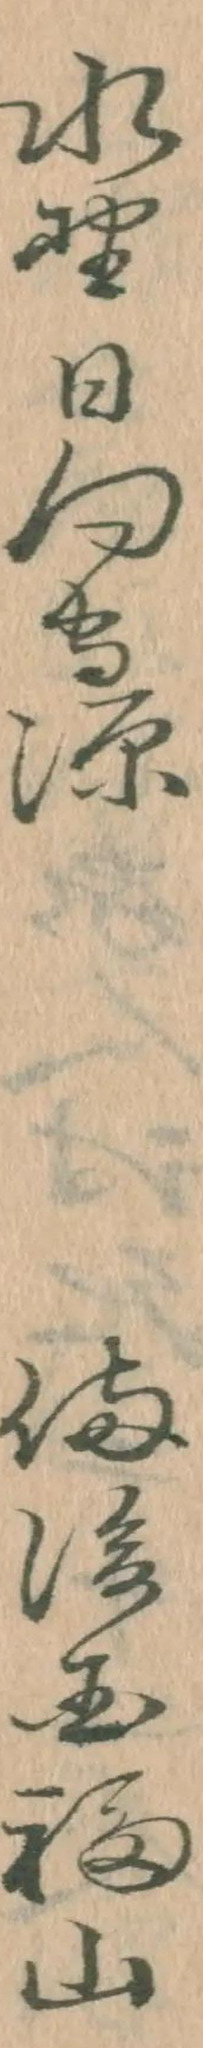水野日向守源備後国福山
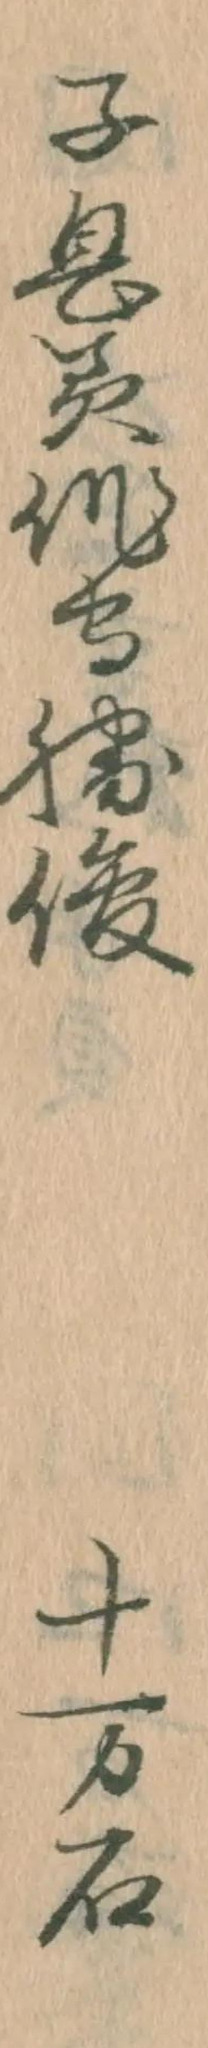子息美作守勝俊十万石
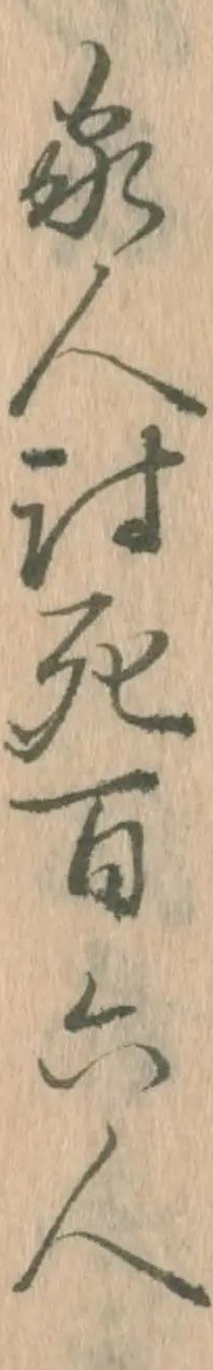家人討死百六人
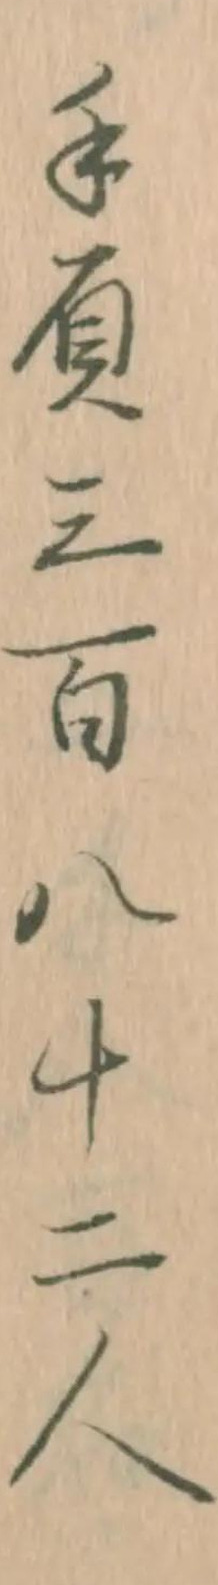手負三百八十二人
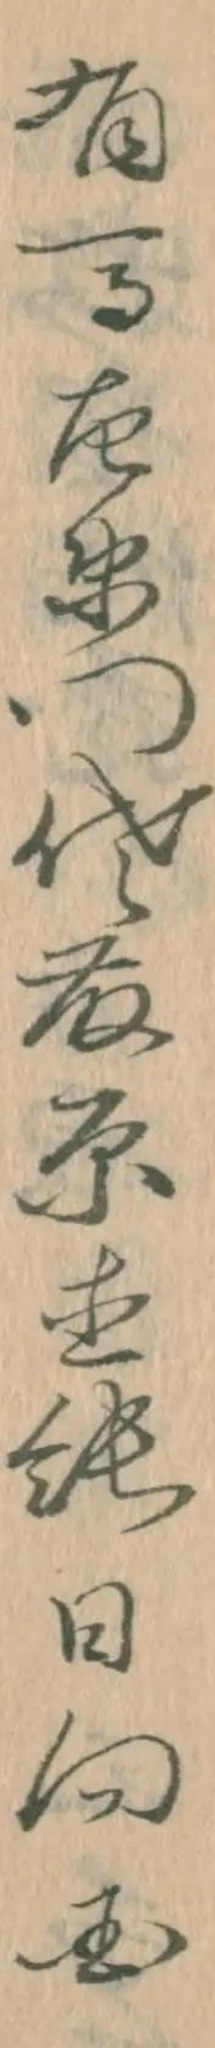有馬左衛門佐藤原直純日向国
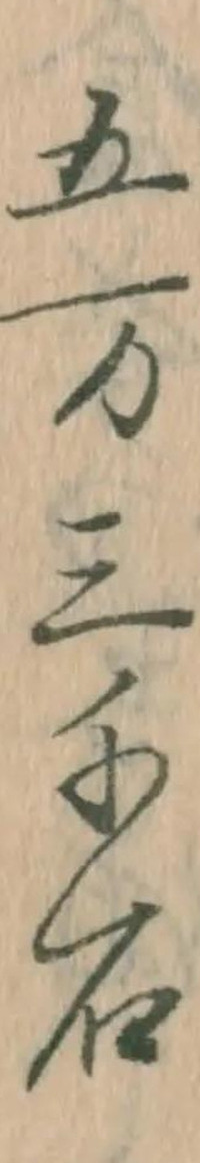三万七千石
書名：切支丹御退治記 49巻. [9]
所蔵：国立国会図書館 National Diet Library, JAPAN
